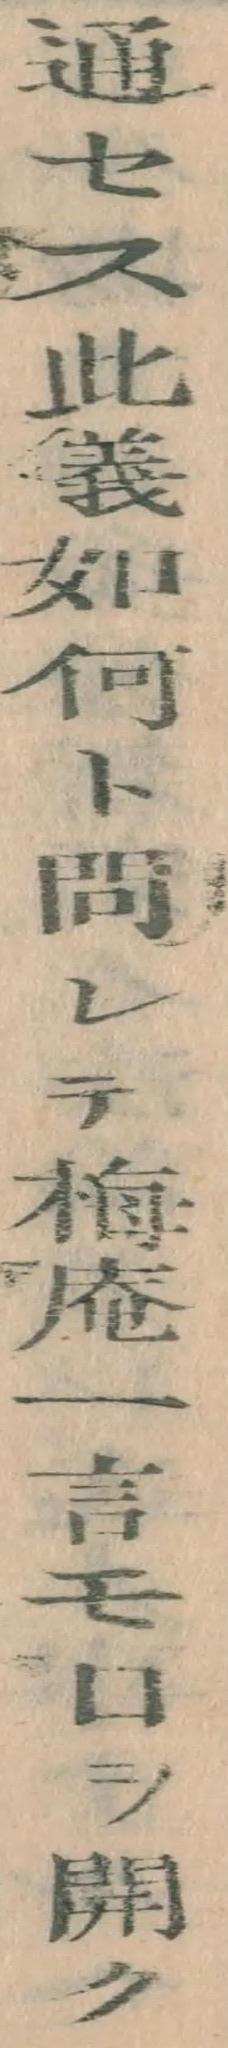通セス此義如何ト問レテ梅庵一言モ口ヲ開ク
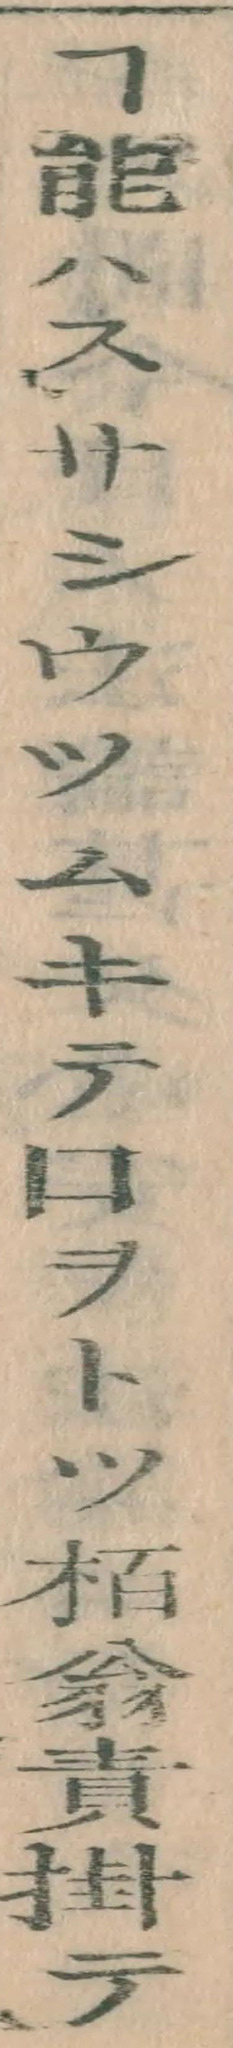ヿ能ハスサシウツムキテ口ヲトツ栢翁責掛テ
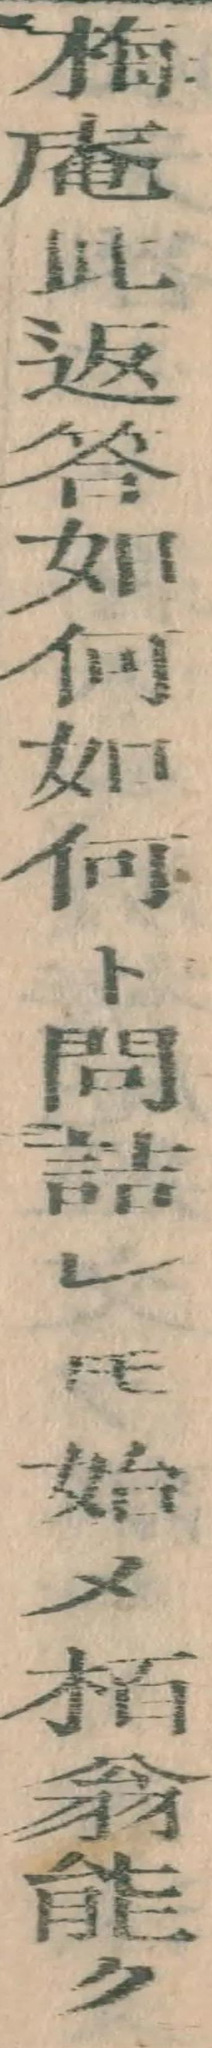梅庵此返答如何如何ト問詰レトモ始メ栢翁能ク
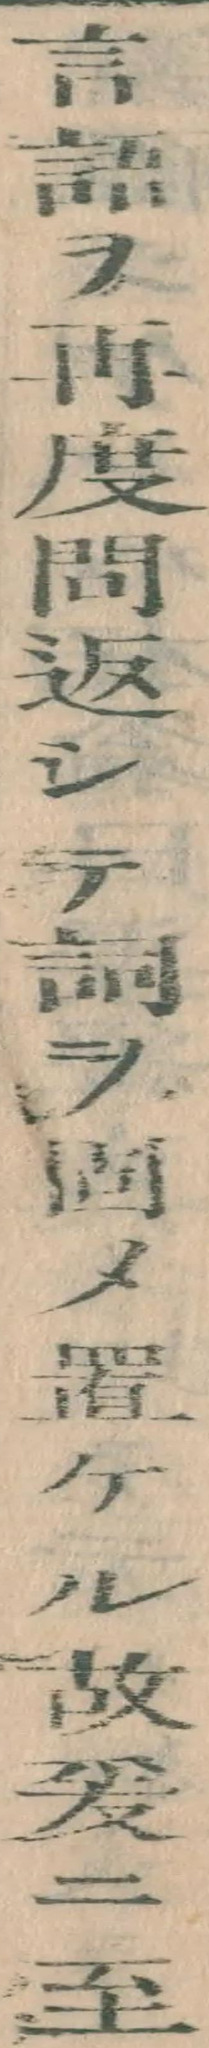言語ヲ再度問返シテ詞ヲ固メ置ケル故爰ニ至
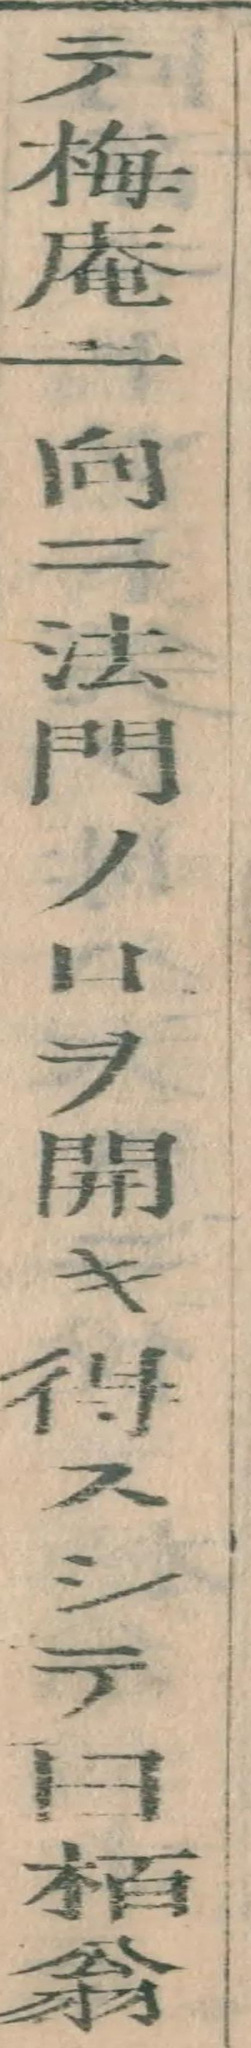テ梅庵一向ニ法門ノ口ヲ開キ得スシテ曰栢翁
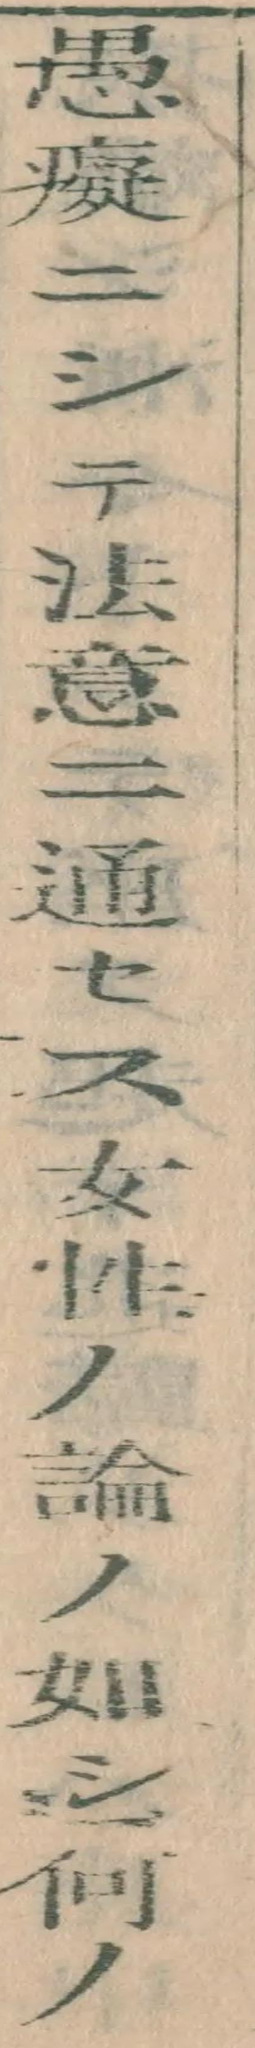愚痴ニシテ法意ニ通セス女性ノ論ノ如シ何ノ
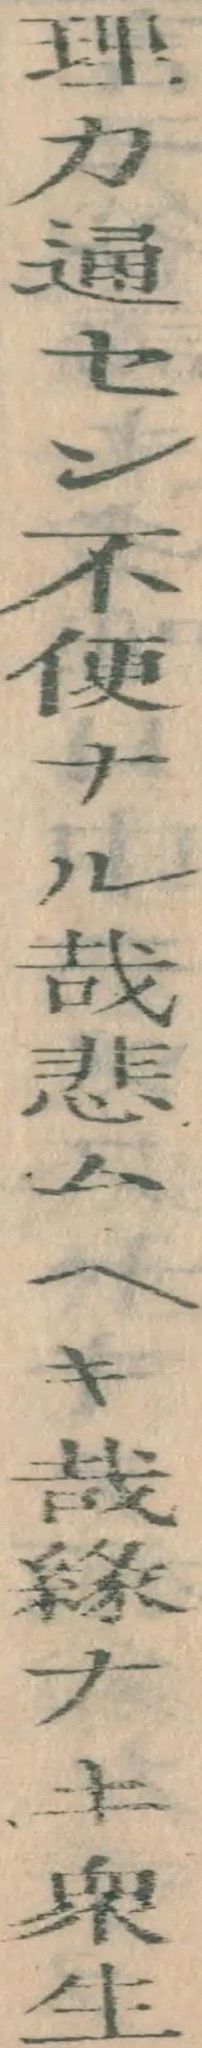理カ通セン不便ナル哉悲ムヘキ哉縁ナキ衆生
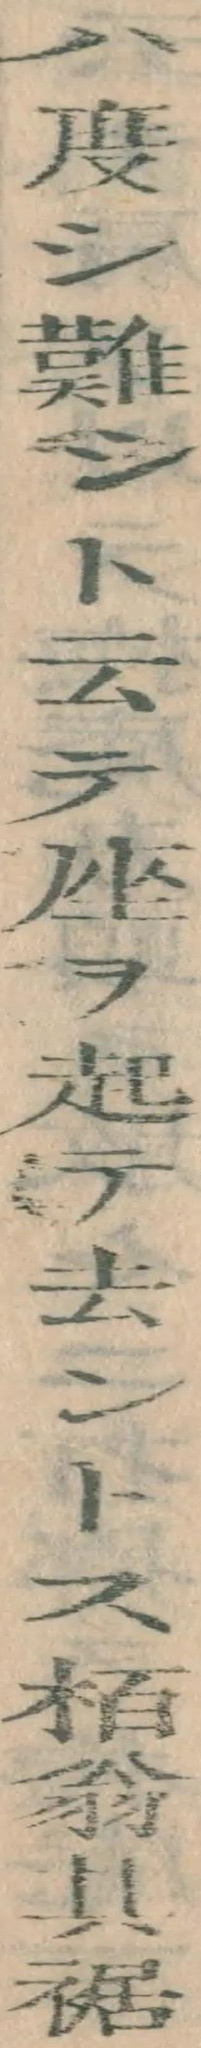ハ度シ難シト云テ座ヲ起テ去ントス栢翁其裾
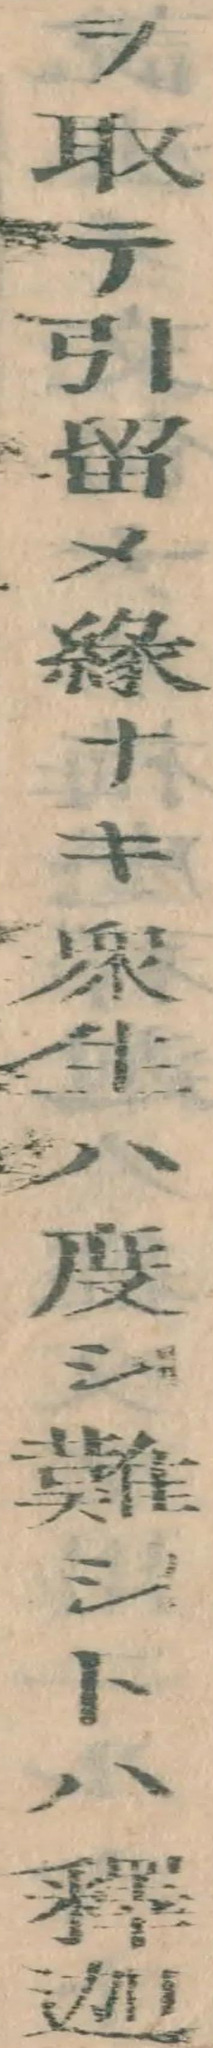ヲ取テ引留メ縁ナキ衆生ハ度シ難シトハ釈迦

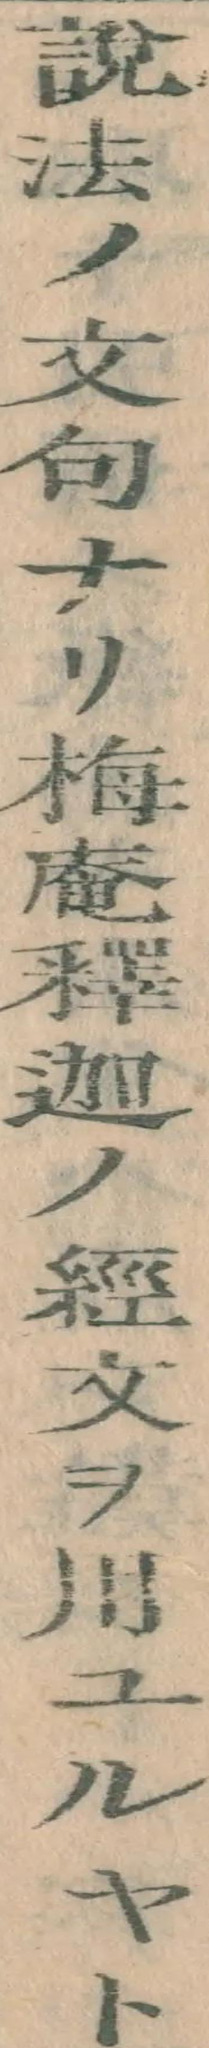説法ノ文句ナリ梅庵釈迦ノ経文ヲ用ユルヤト
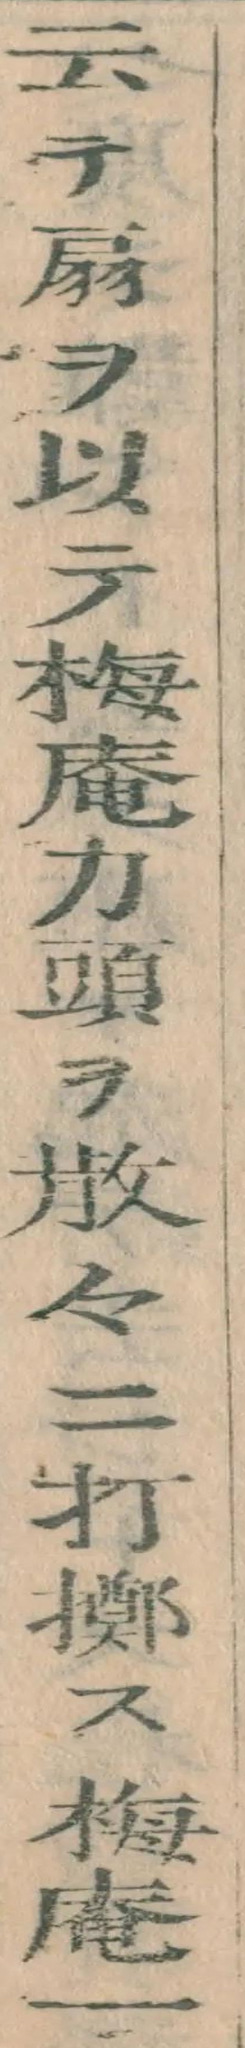云テ扇ヲ以テ梅庵カ頭ヲ散々ニ打擲ス梅庵一
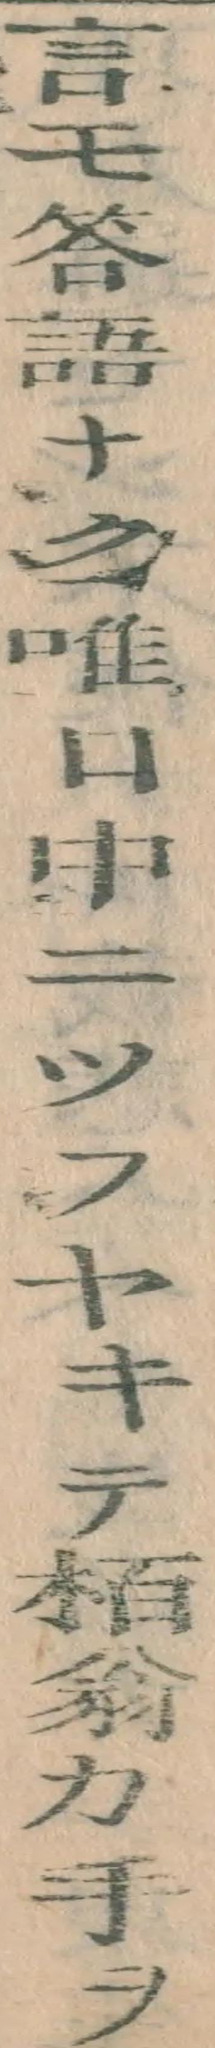言モ答語ナク唯口中ニツフヤキテ栢翁カ手ヲ
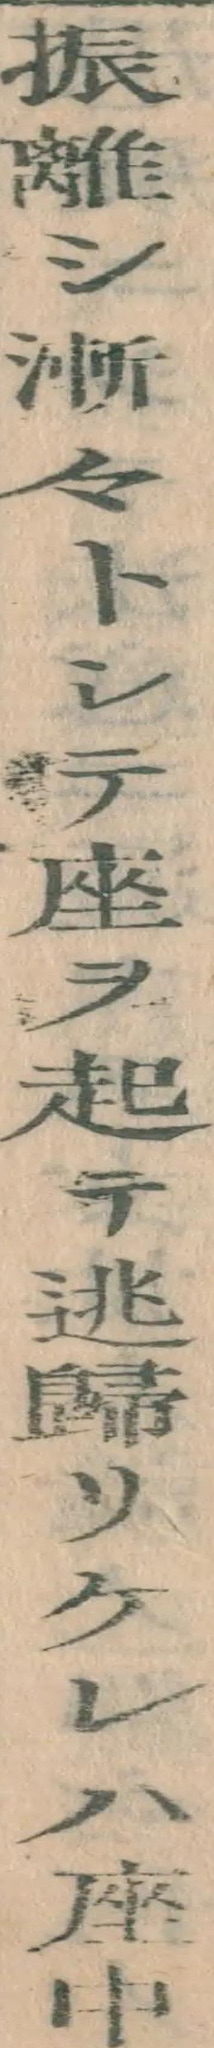振離シ漸々トシテ座ヲ起テ逃帰リケレハ座中
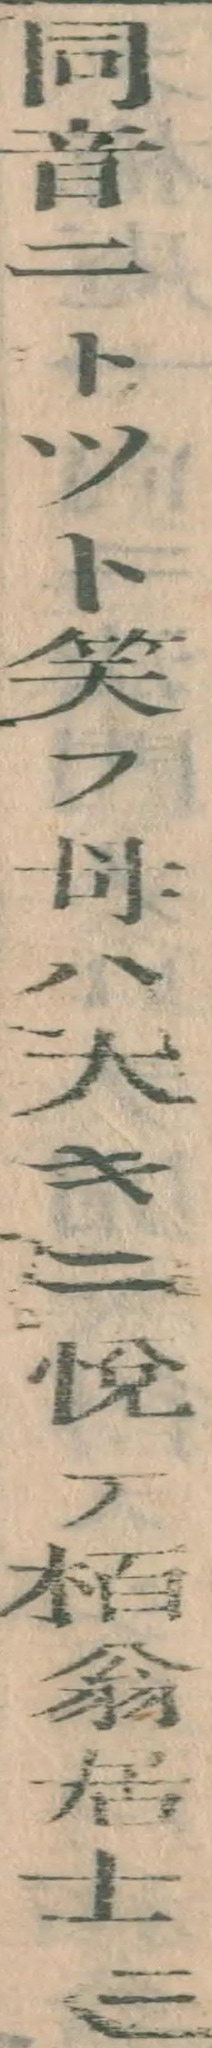同音ニトツト笑フ母ハ大キニ悦テ栢翁居士ニ
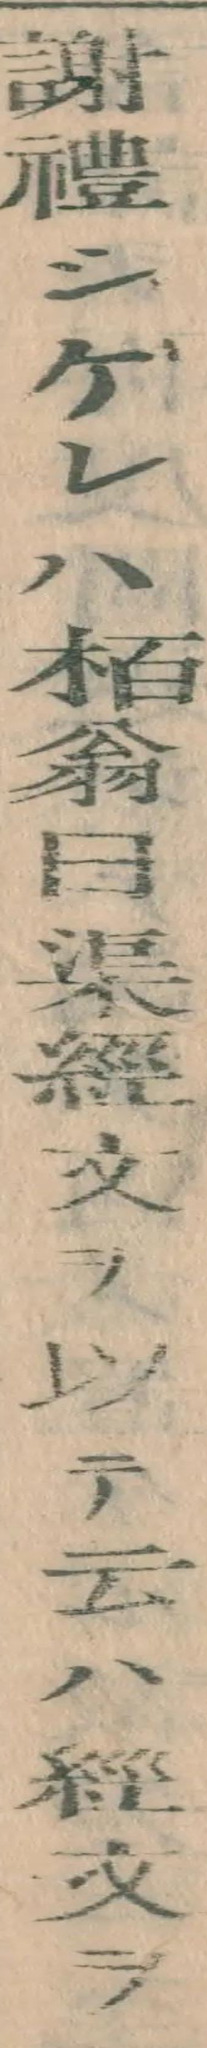謝礼シケレハ栢翁曰渠経文ヲ以テ云ハ経文ヲ
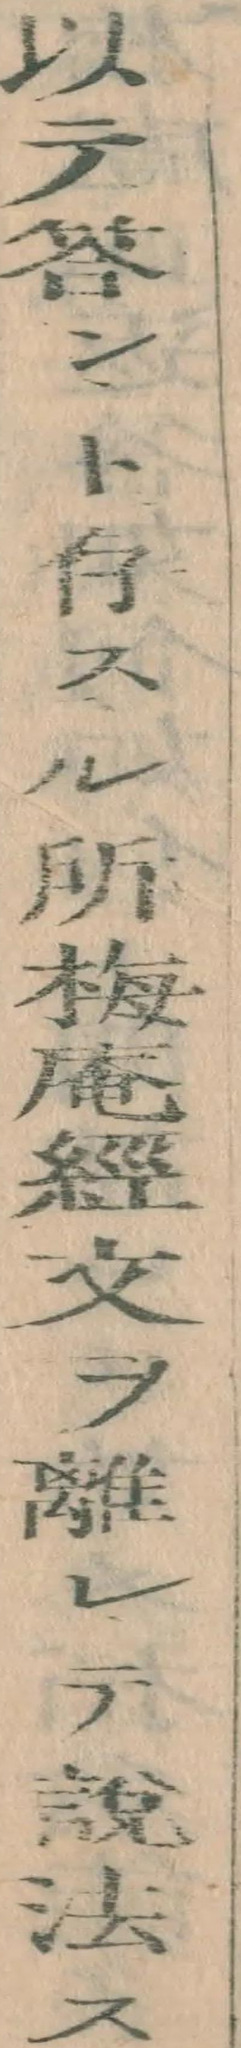以テ答ント存スル所梅庵経文ヲ離レテ説法ス
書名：南蛮寺興廃記
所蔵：国立国会図書館 National Diet Library, JAPAN
